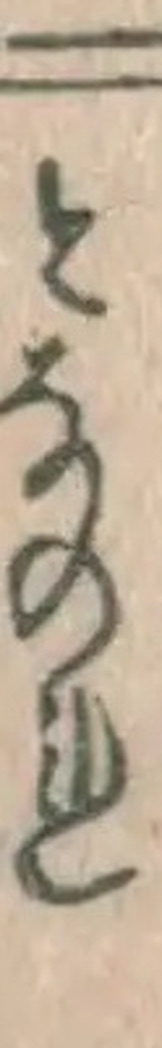となのれ
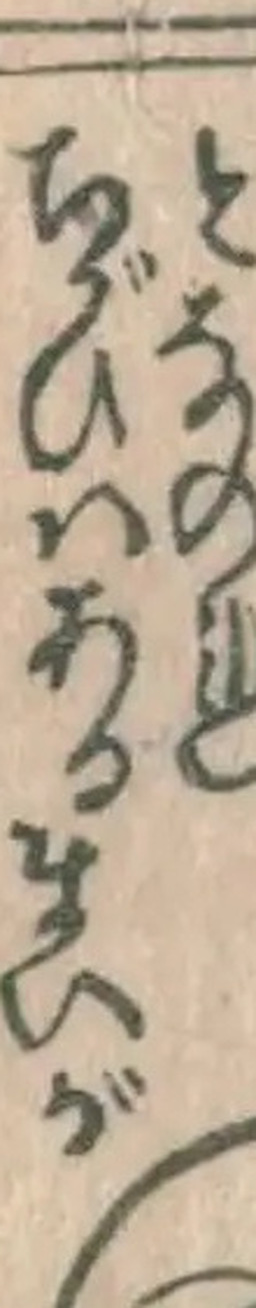ちがひあるまいが
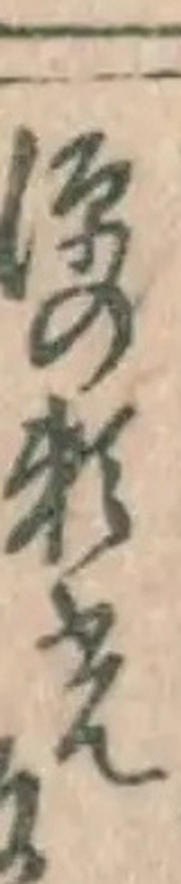源の頼光
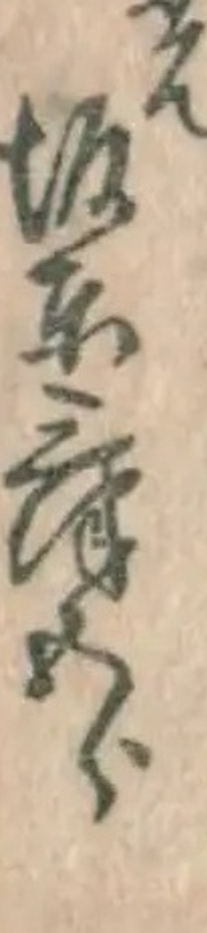坂東三津五郎

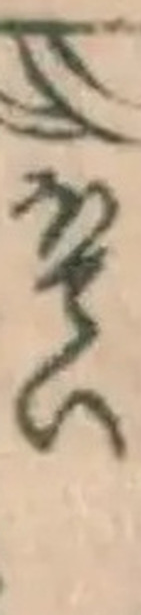ほてい
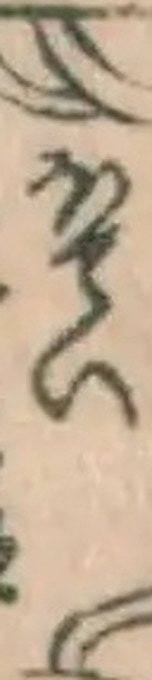ほてい
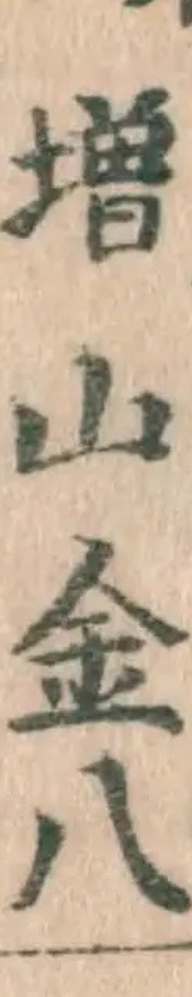増山金八
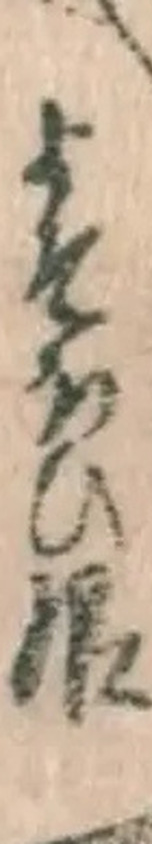よそほひ姫
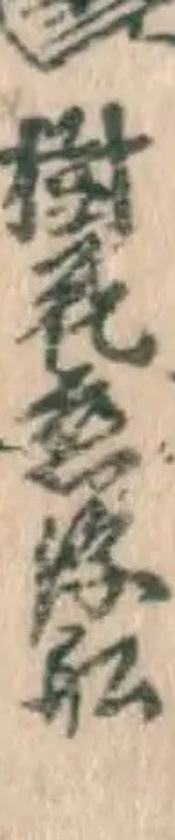樹花恋浮船
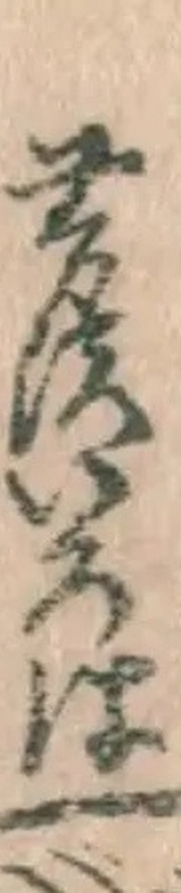芳沢いろは
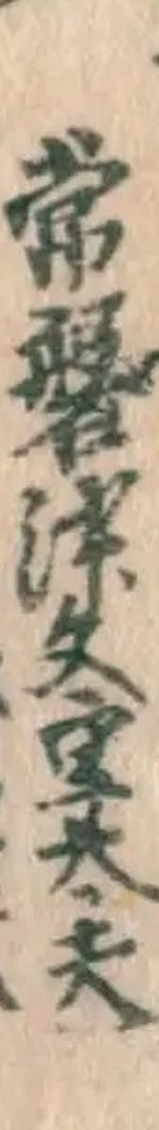常磐津文字太夫
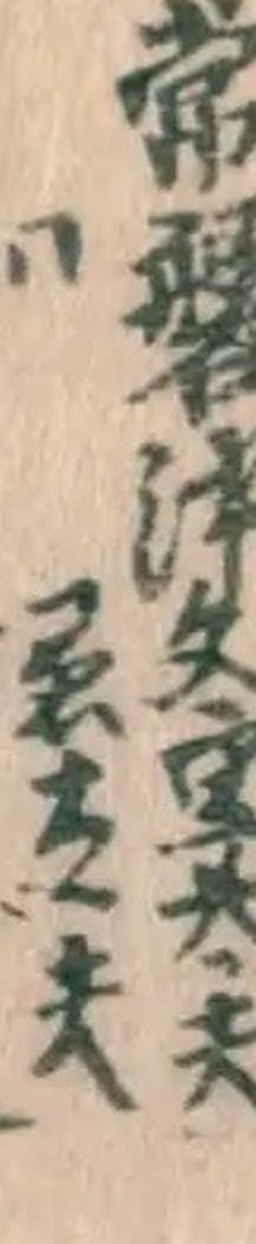同愚太夫
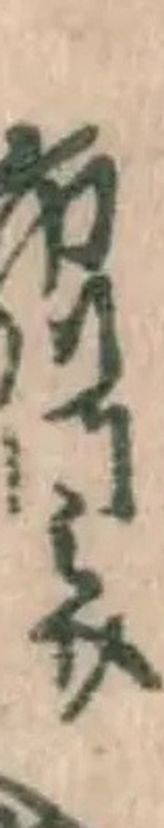市川門之助
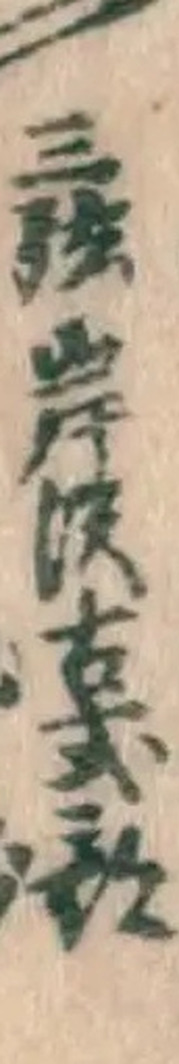三弦岸沢古式部
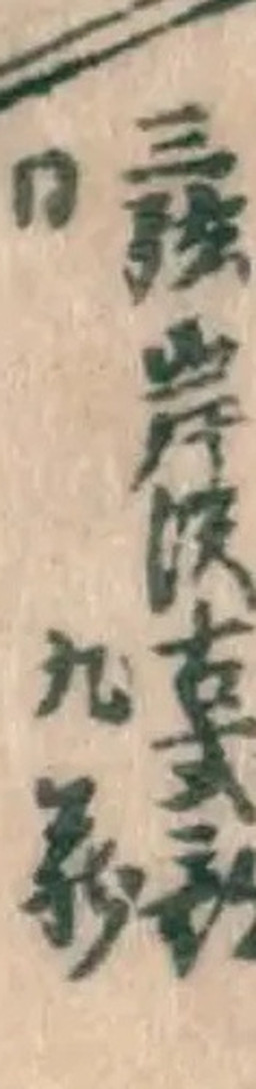同九蔵
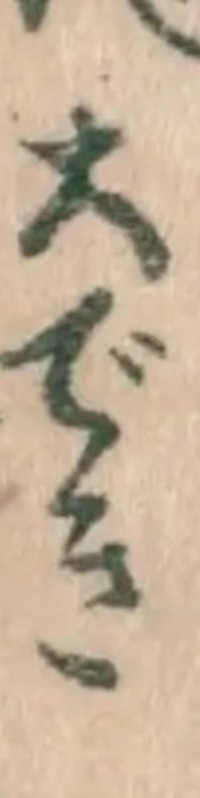大でき
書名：菊慈童酒宴岩窟
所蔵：国立国会図書館 National Diet Library, JAPAN
